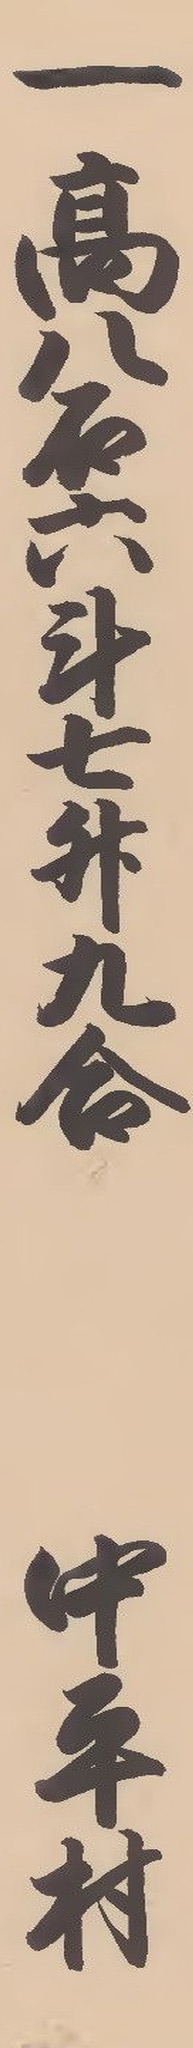一高八石六斗七升九合中平村
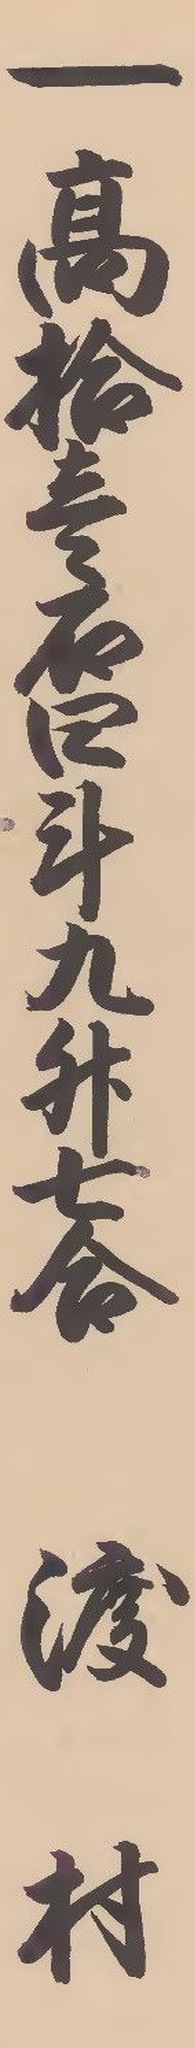一高拾壱石四斗九升七合渡村

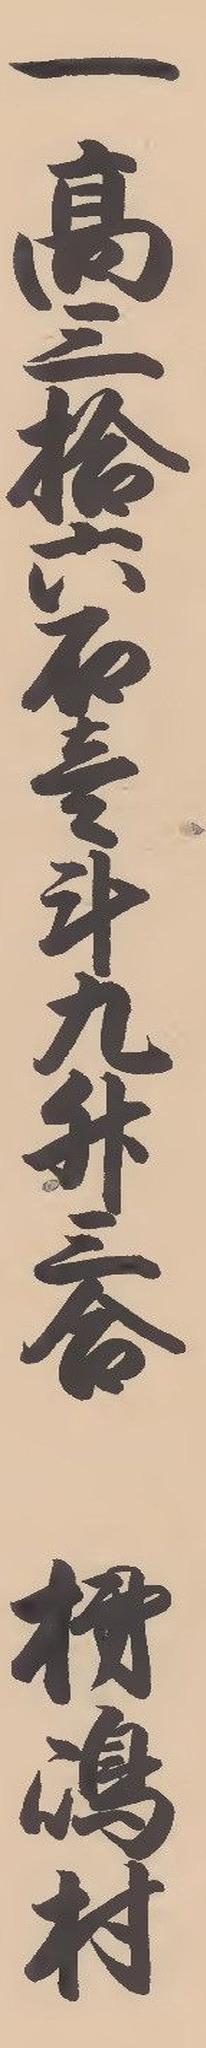一高三拾六石壱斗九升三合柿島村
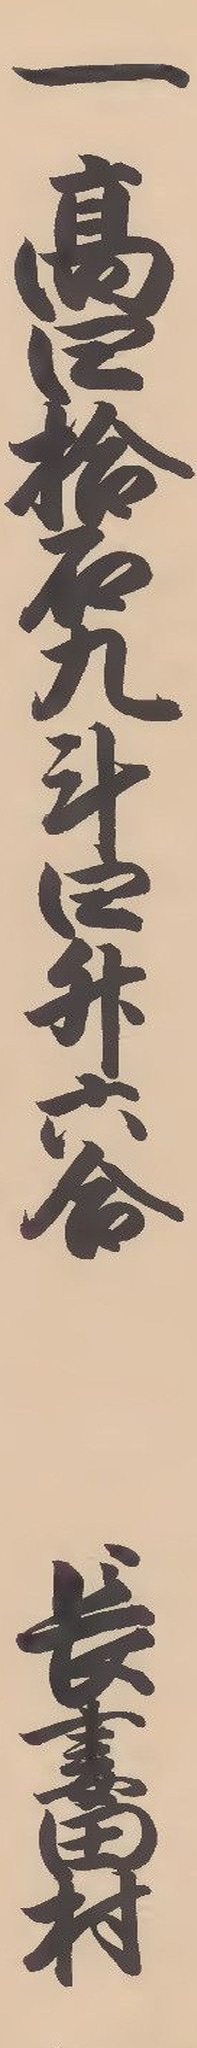一高四拾石九斗四升六合長妻田村
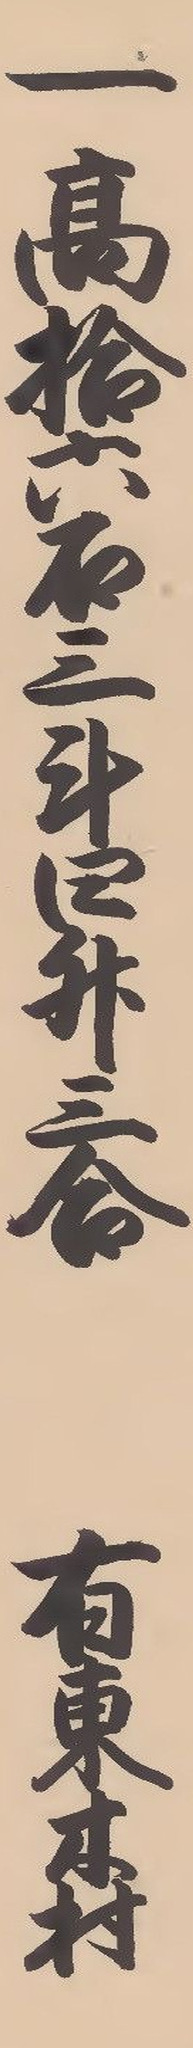一高拾六石三斗四升三合有東木村
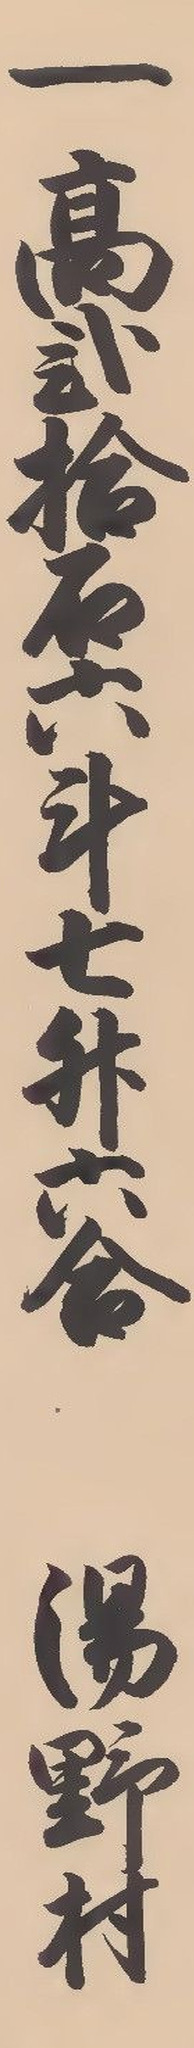一高弐拾石六斗七升六合湯野村
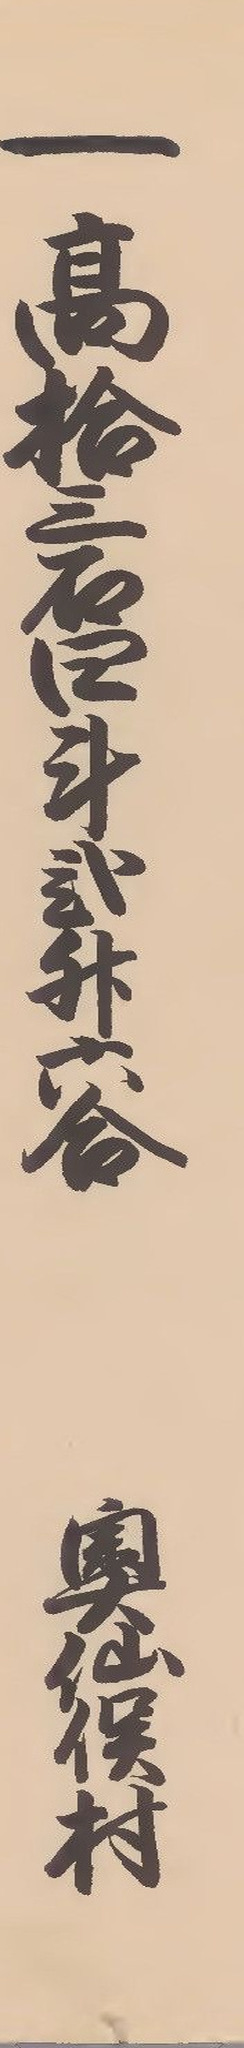一高拾三石四斗弐升六合奥仙俣村
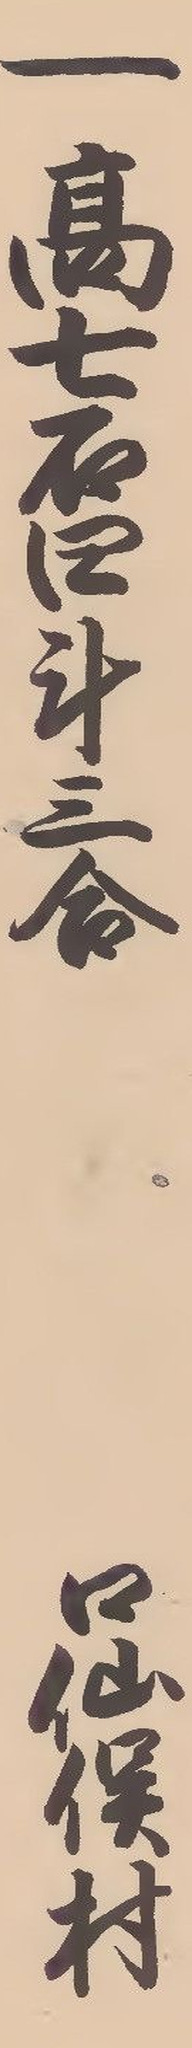一高七石四斗三合口仙俣村

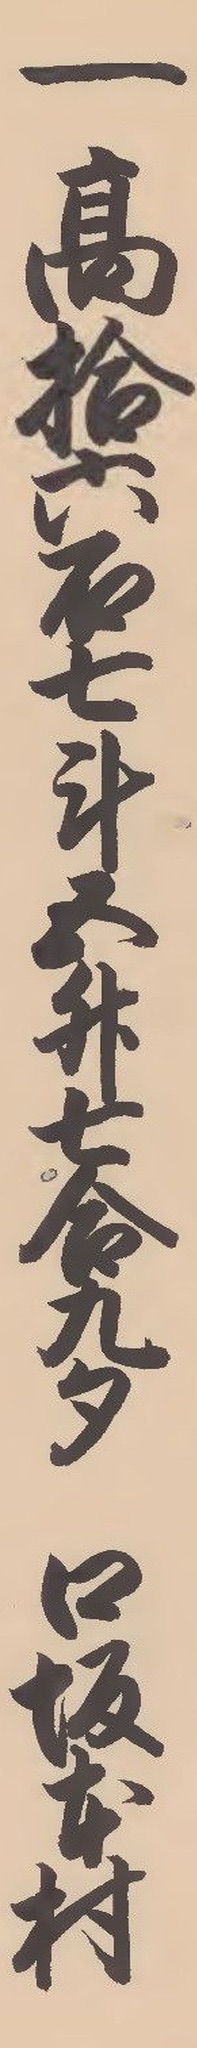一高拾六石七斗五升七合九勺口坂本村
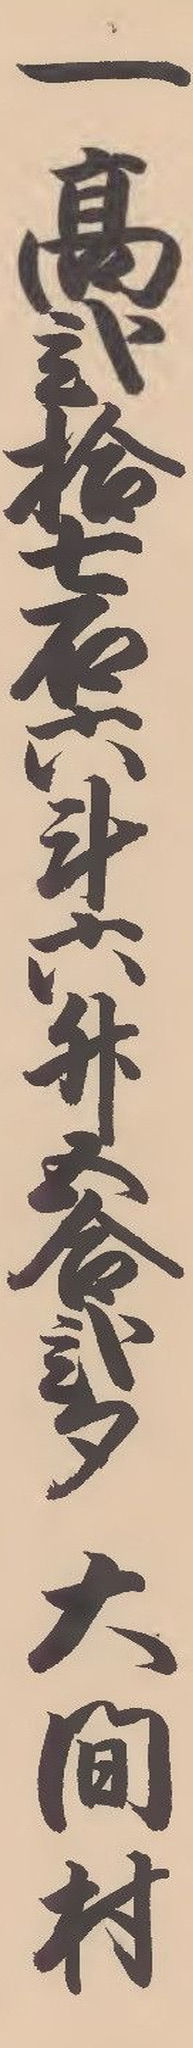一高弐拾七石六斗六升五合弐勺大間村
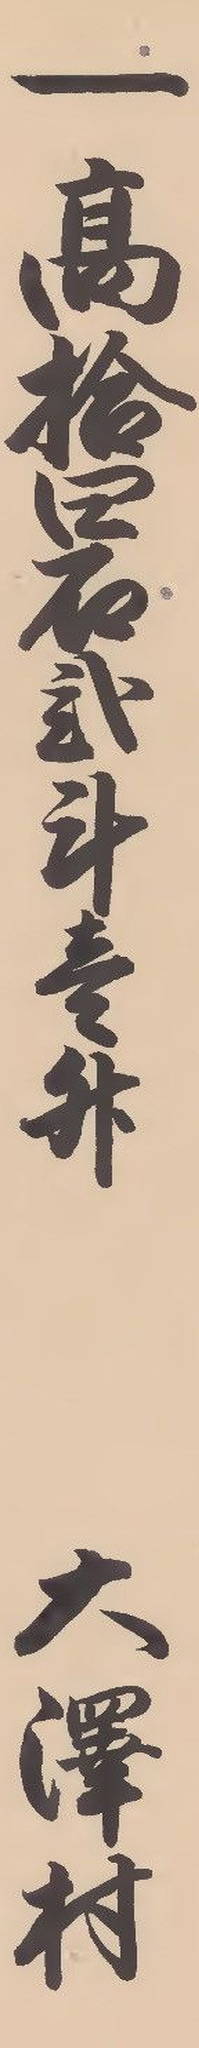一高拾四石弐斗壱升大沢村
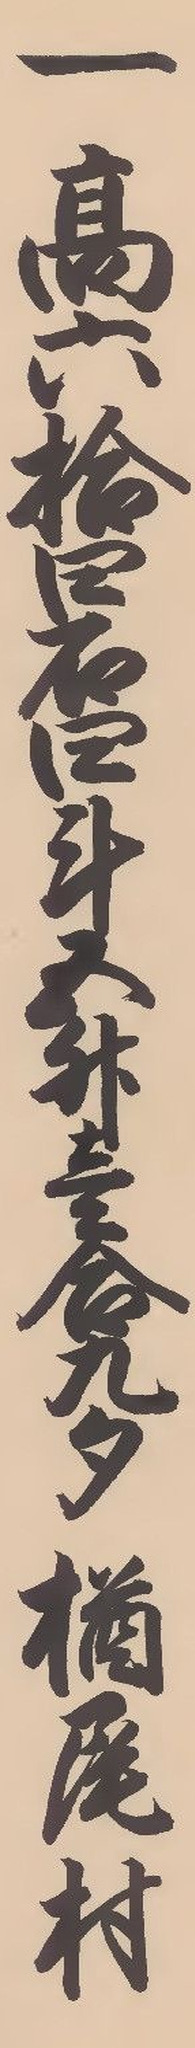一高六拾四石四斗五升壱合九勺楢尾村
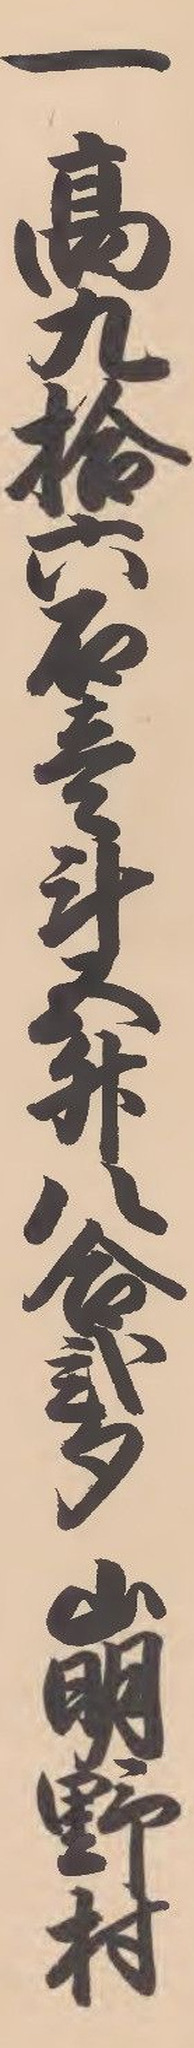一高九拾六石壱斗五升八合弐勺崩野村
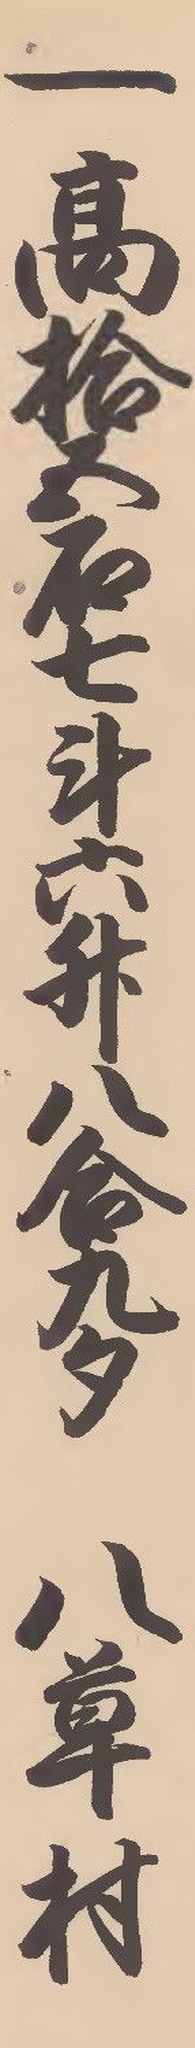一高拾五石七斗六升八合九勺八草村
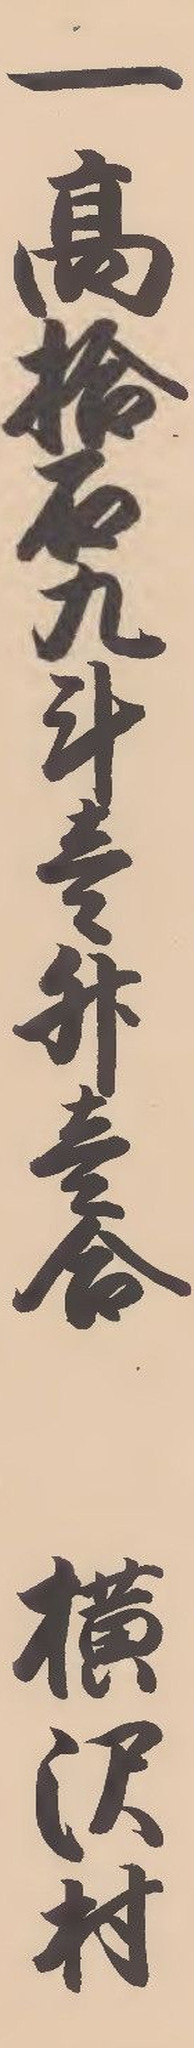一高拾石九斗壱升壱合横沢村
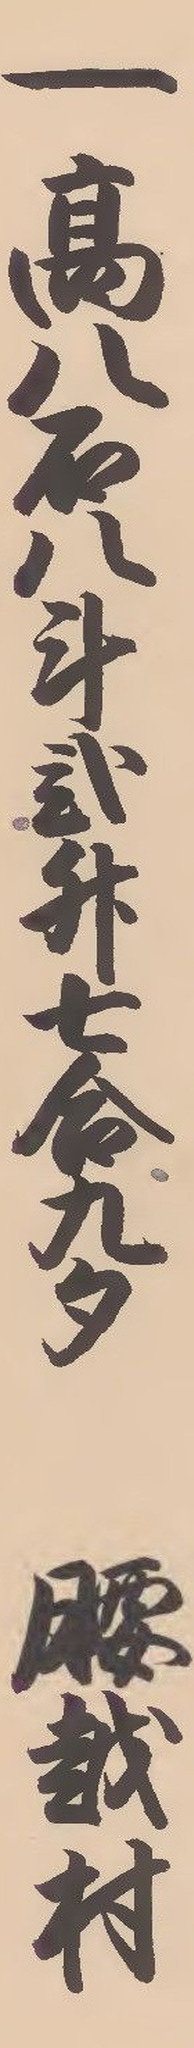一高八石八斗弐升七合九勺腰越村
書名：駿河国郷帳
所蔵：国立公文書館 National Archives of Japan
